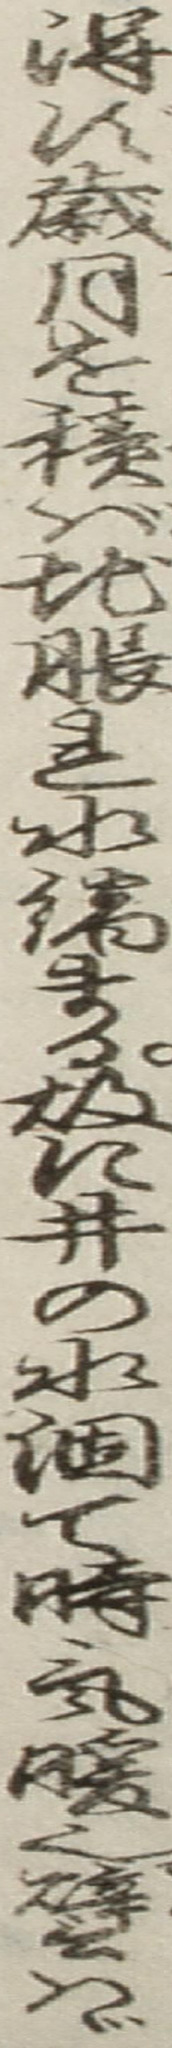得ず。歳月を積ば。地脹れ水縮まる。故に井の水涸て時気暖也也。譬はゞ
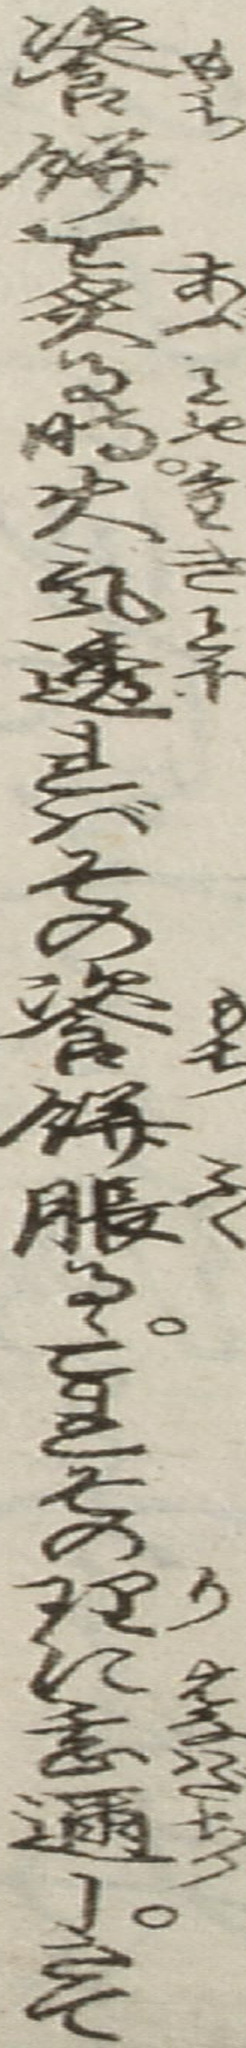餈餅を炙る時。火気透ればその餈餅脹るゝ。これその理に甚邇し。さて
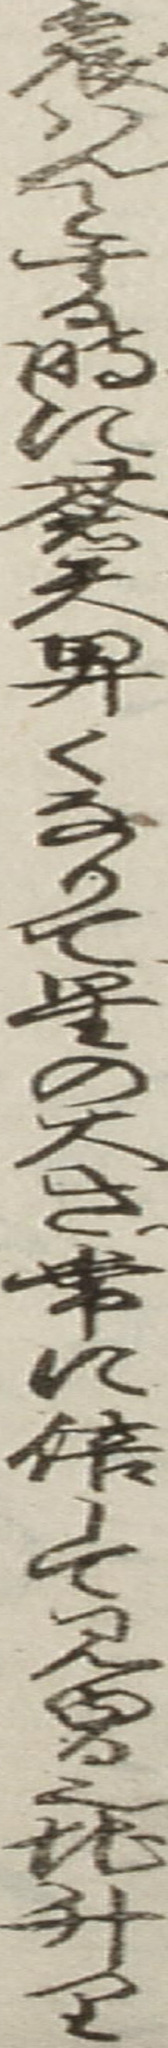震はんとする時に。蒼天畀くなりて星の大さ。常に倍して見ゆる也。地升り
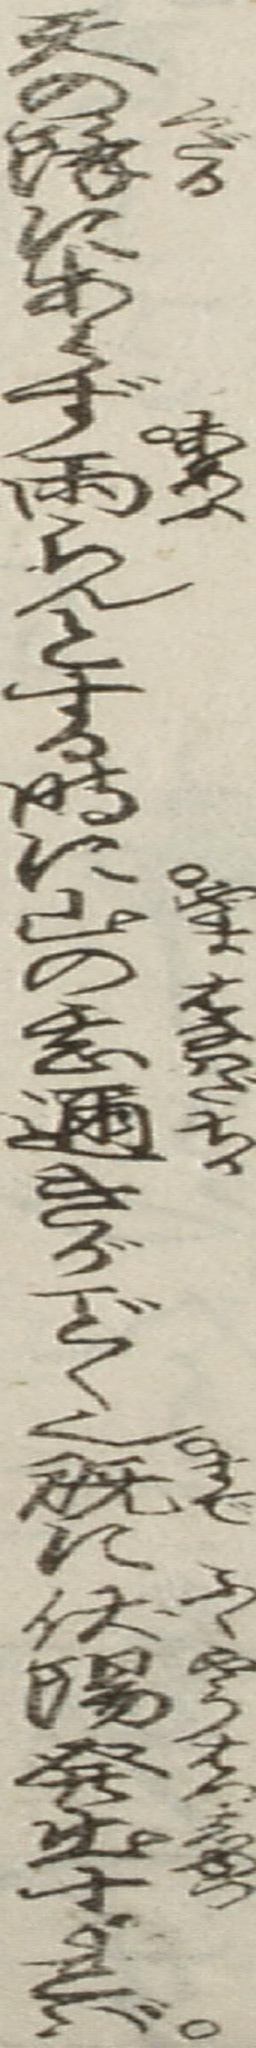天の降にあらず。雨らんとする時に。山の甚邇きがごとく也。既に伏陽発出すれば。
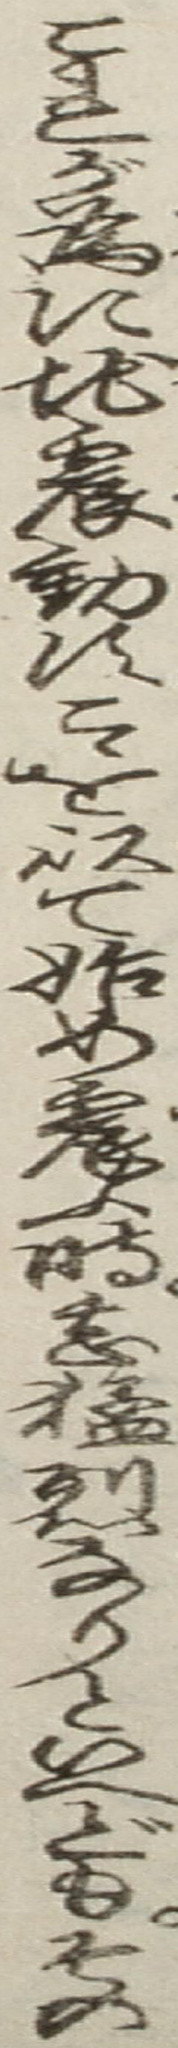これが為に地震動す。こゝを以て始め震ふ時。甚猛烈なりといへども。その
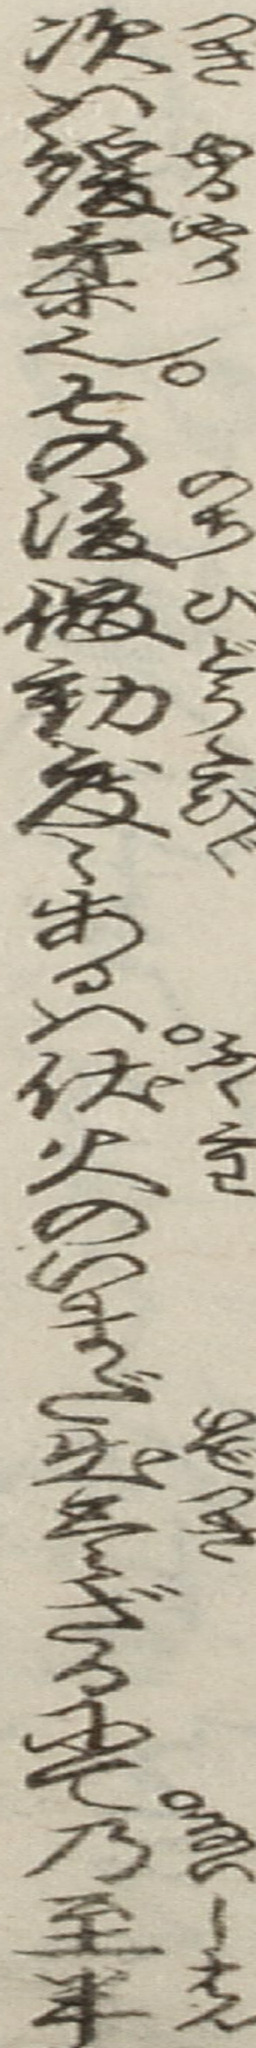次は緩柔也。その後微動度々あるは伏火のいまだ出尽ざるにて。乃至半
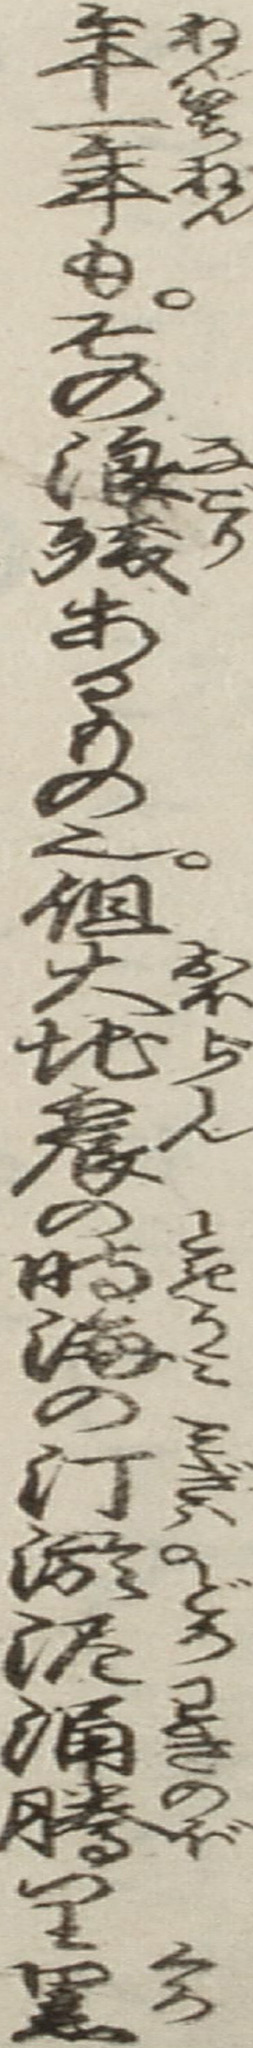年一年も。その浪残あるもの也。但大地震の時海の汀。游泥涌騰り黒
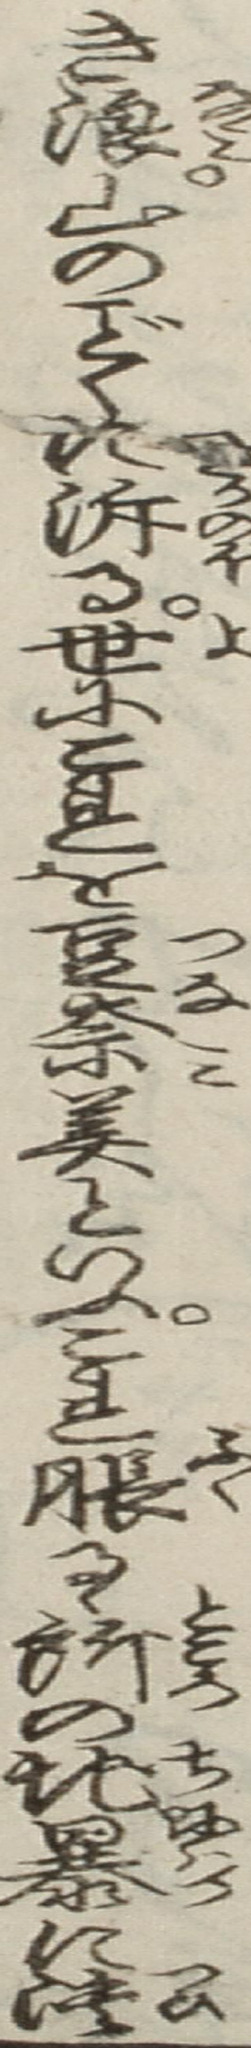き浪。山のごとくに泝る。世にこれを豆奈美といふ。これ脹るゝ所の地暴に潰
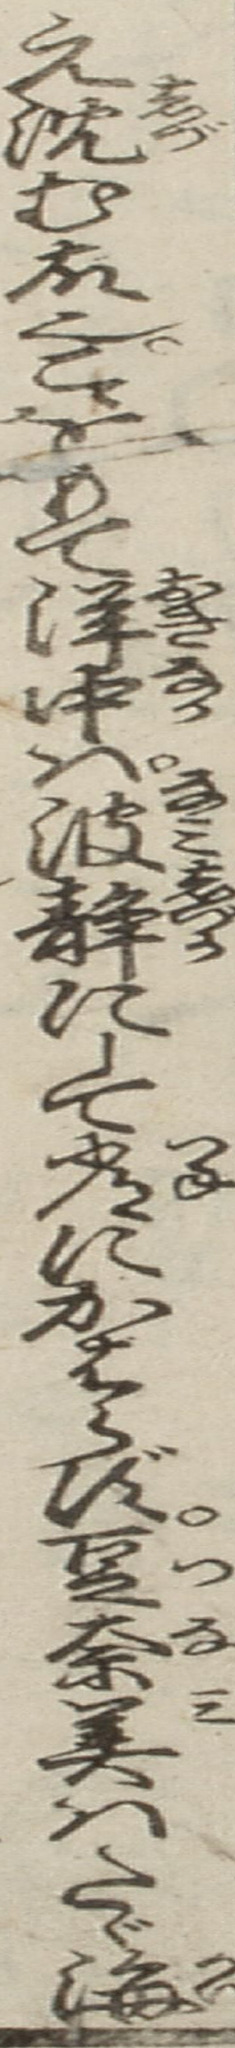え沈む故也。こゝをもて洋中は。波静にして常にかはらず豆奈美はたゞ海
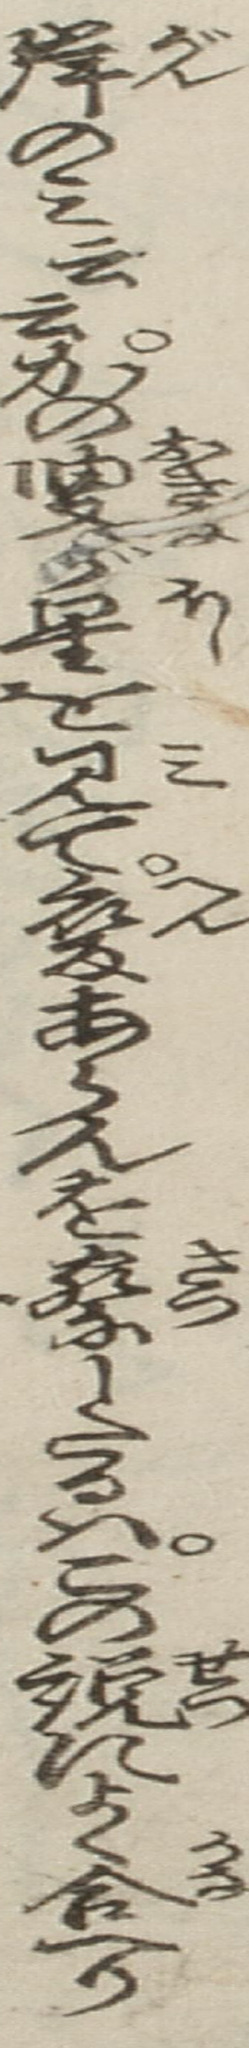岸のみ云云。かの叟が星を見て。変あらんを察したるは。この説によく合へり
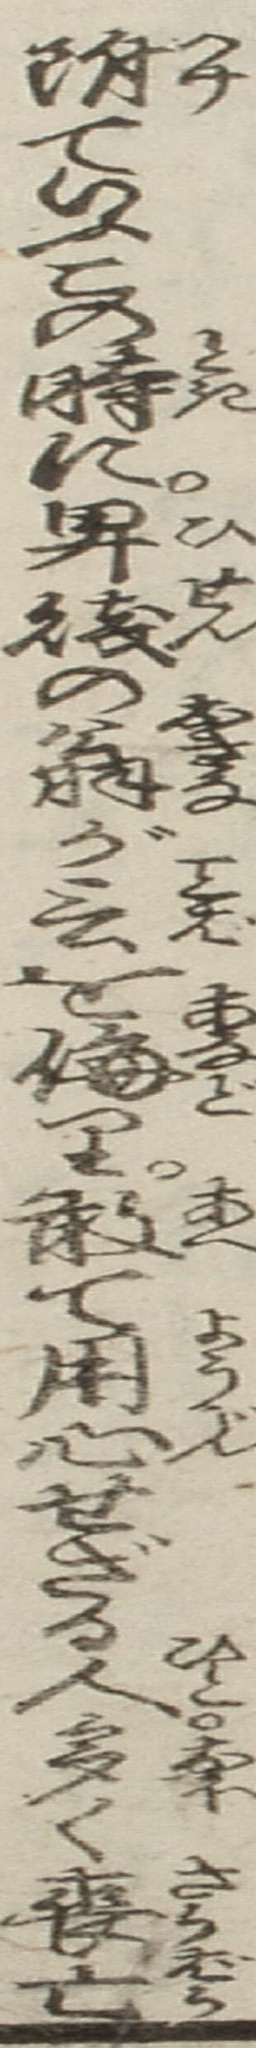附ていふこの時に。卑賤の翁が言を侮り。敢て用心せざる人。多く喪亡
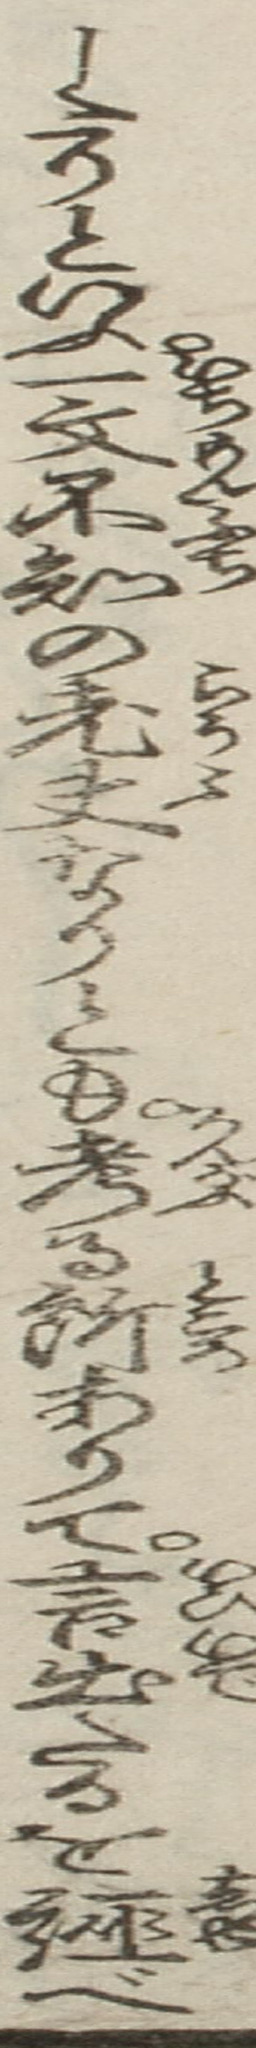したりといふ。一文不知の老夫なりとも。考る所ありて。言出たるを誣べ
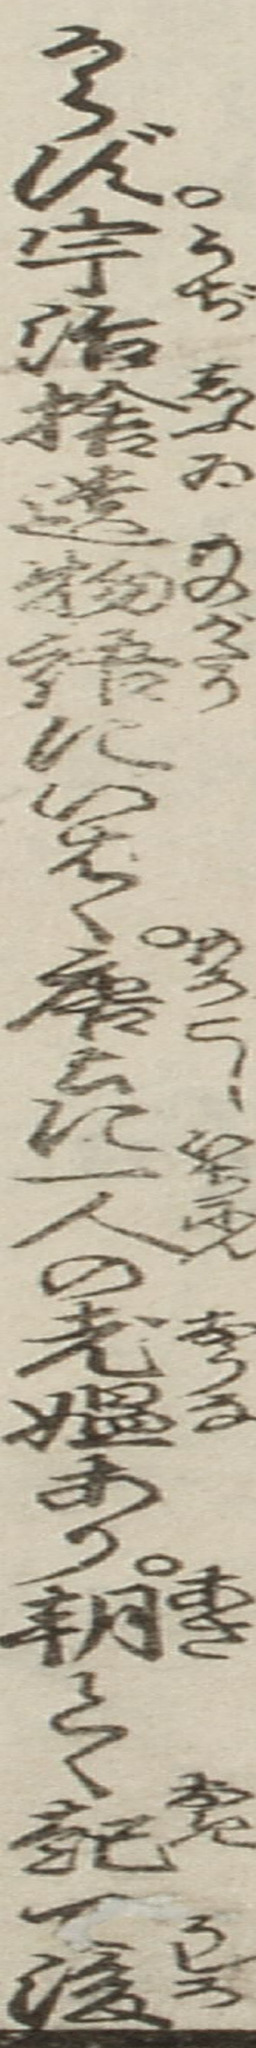からず。宇治捨遺物語にいはく。唐土に一人の老媼あり。朝とく起て後
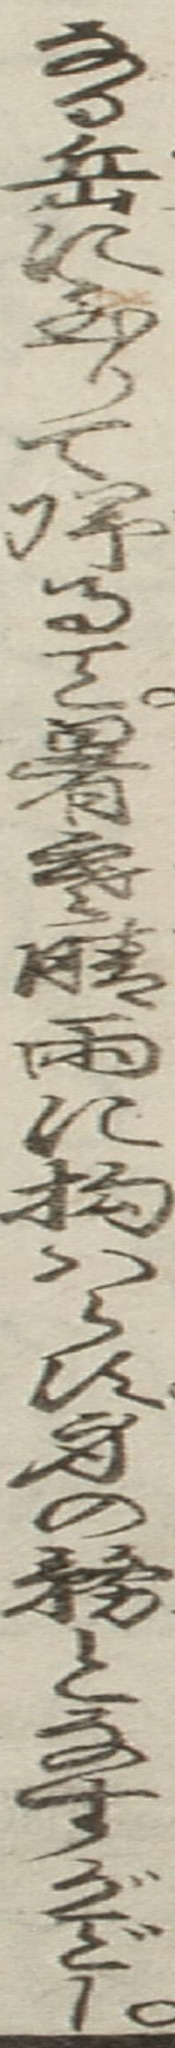なる丘に至りて帰ること。暑寒晴雨に拘はらす。身の務となすがごとし。
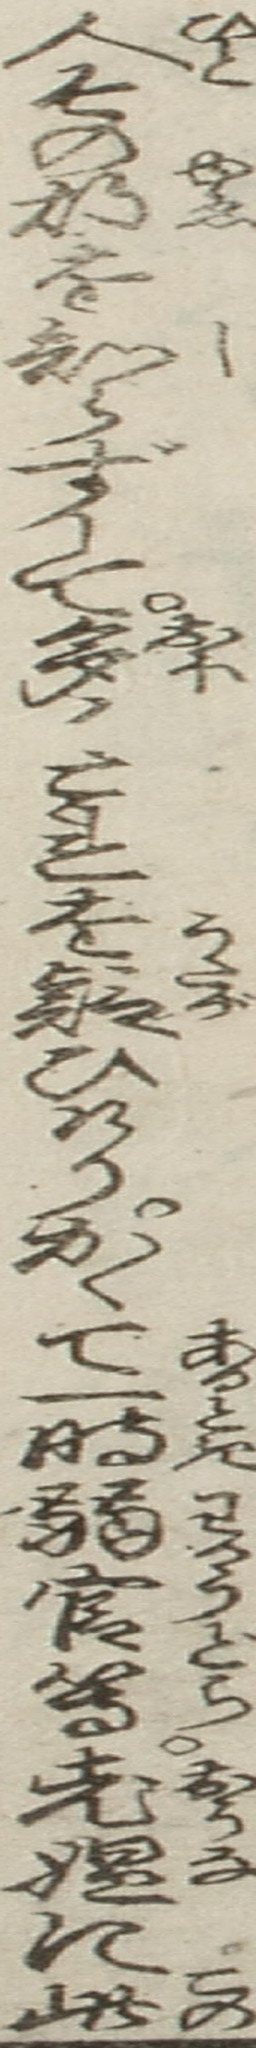人その故を知らずして。多くこれを疑ひけり。かくて一時弱官等。老媼に此
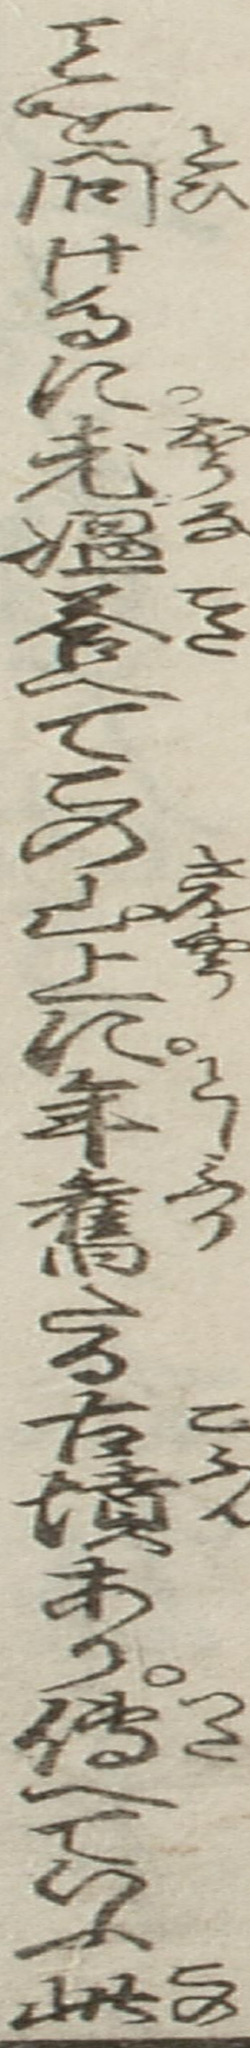ことを問けるに。老媼答へてこの山上に。年舊たる古墳あり。伝へていふ此
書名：安政見聞録　上
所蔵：東京大学地震研究所図書室 Earthquake Research Institute Library, The University of Tokyo, JAPAN
